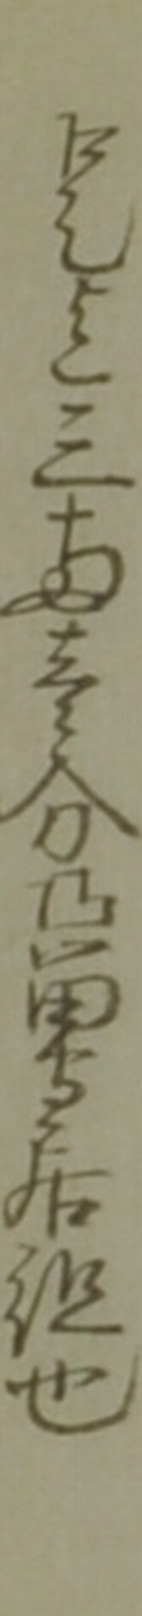是迄三両壱分御留守居組也
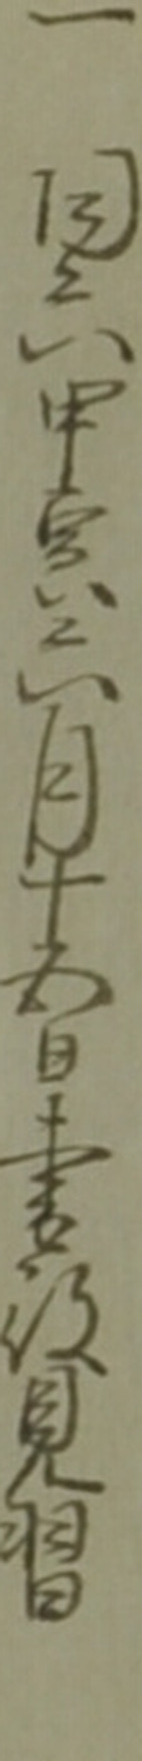一同六甲寅六月十五日書役見習
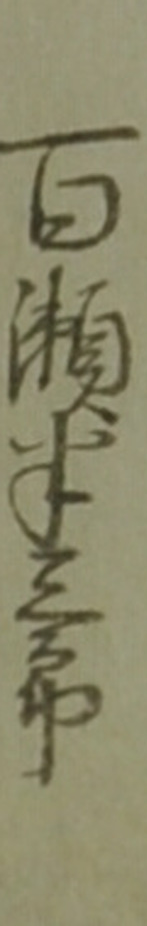百瀬半三郎
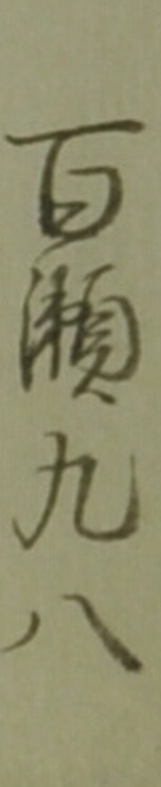百瀬九八
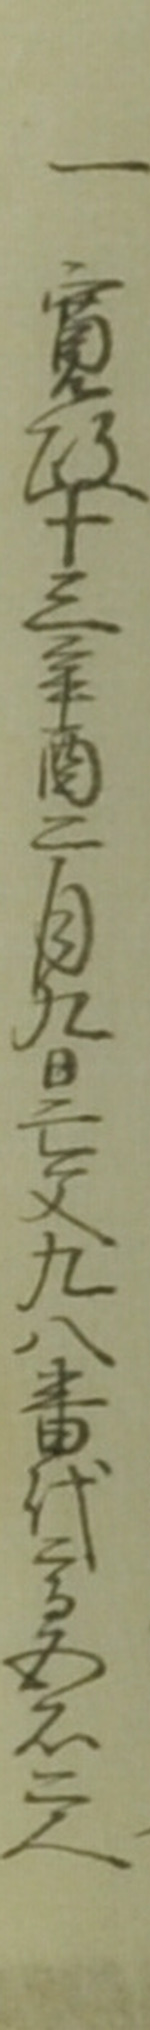一寛政十三辛酉二月九日亡父九八番代高五石二人

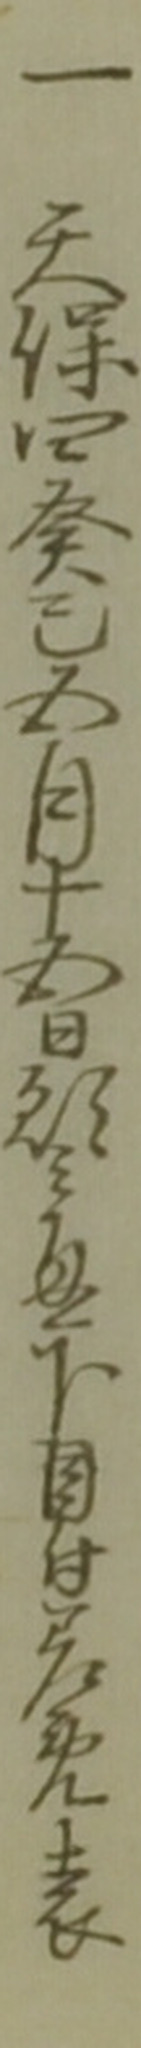一天保四癸巳五月十五日願之通下目付差免表
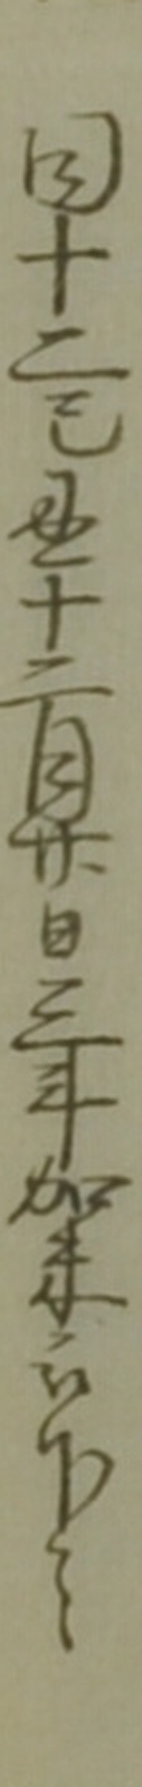一同十二己丑十二月廿日三斗加米被下之
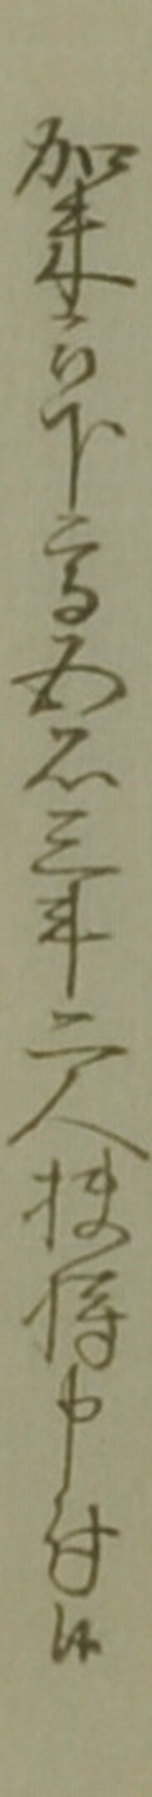加米被下高五石三斗二人扶持申付候
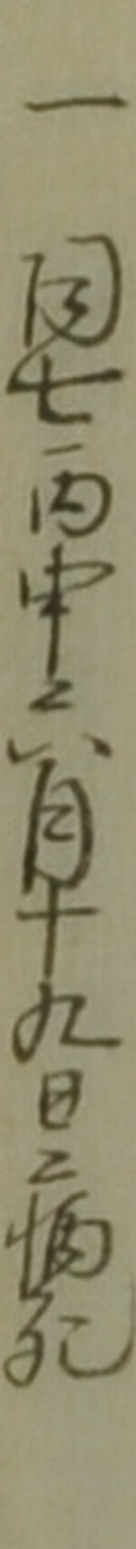一同七丙申六月十九日病死
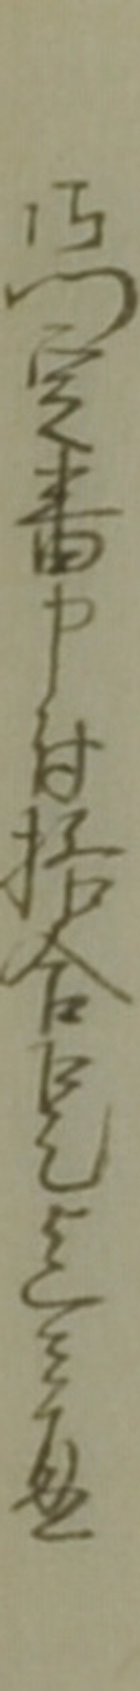御門定番申付格合是迄之通
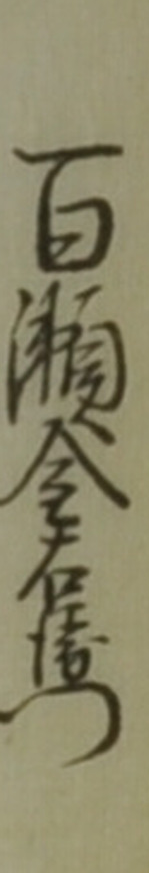百瀬金右衛門
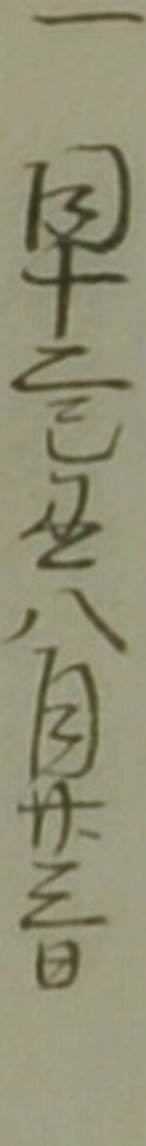一同十二己丑八月廿三日
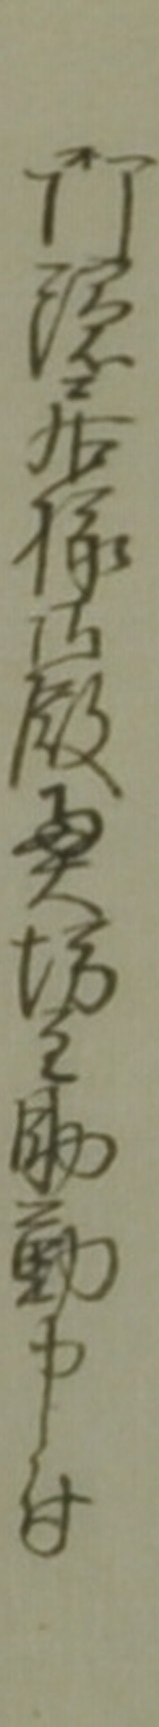御隠居様御殿奥坊主助勤申付
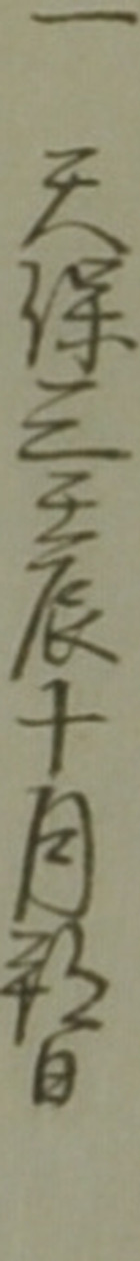一天保三壬辰十月朔日
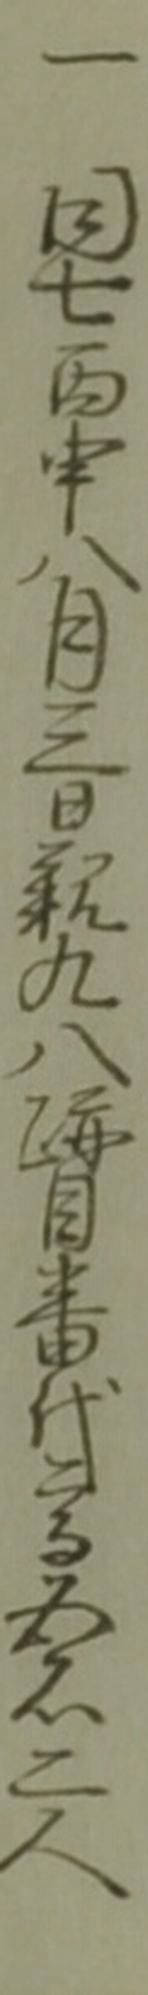一同七丙申八月三日親九八跡目番代高五石二人
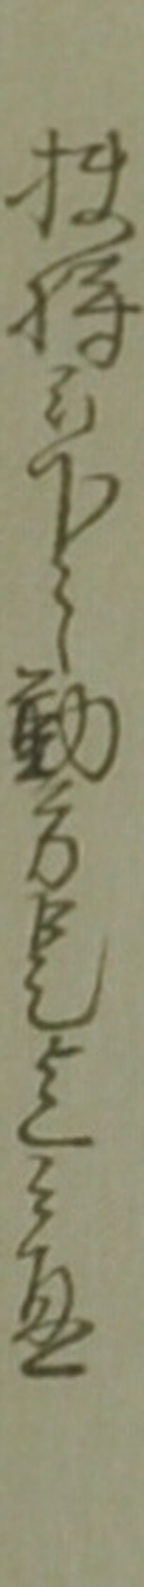扶持被下之勤方是迄之通
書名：無足諸士勤仕録（九）
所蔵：伊那市立高遠町図書館・合同会社AMANE
